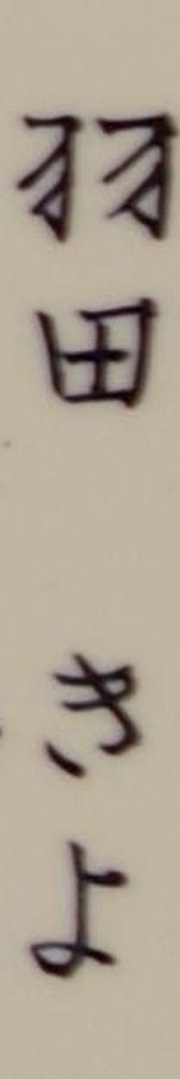羽田きよ
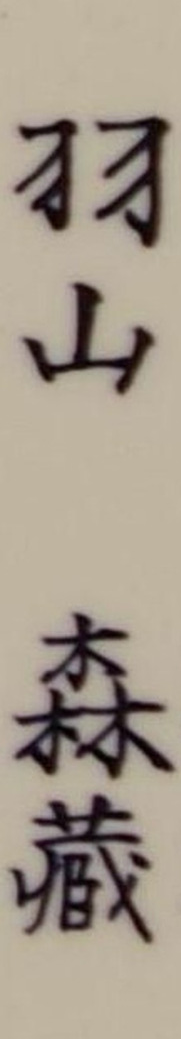羽山森蔵
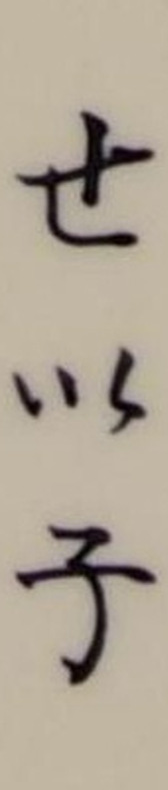せい子
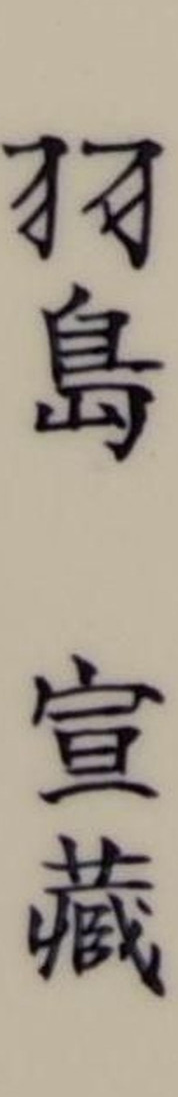羽島宣蔵
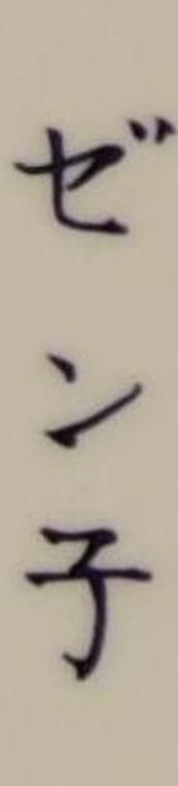ゼン子

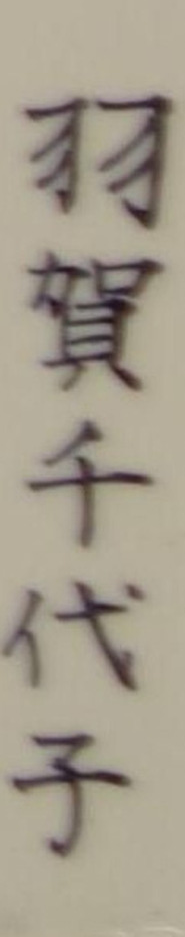羽賀千代子
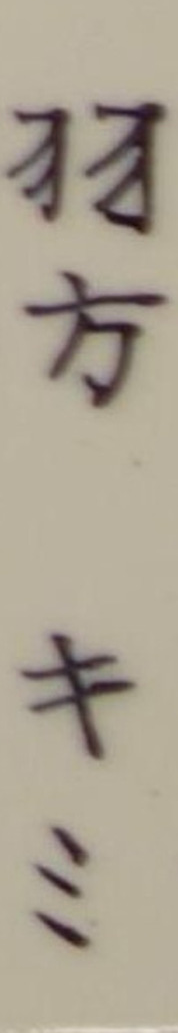羽方キミ
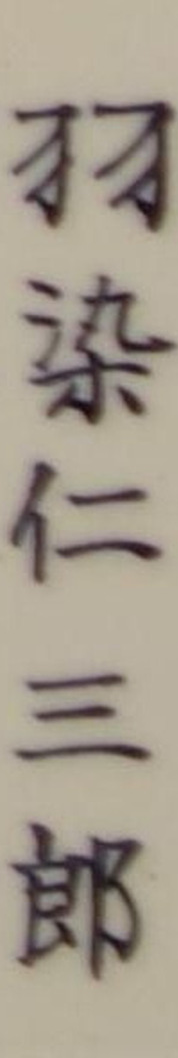羽染仁三郎
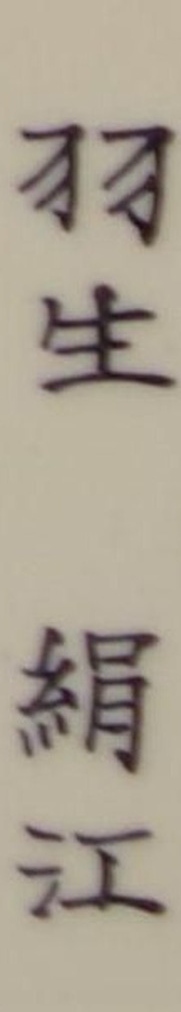羽生絹江
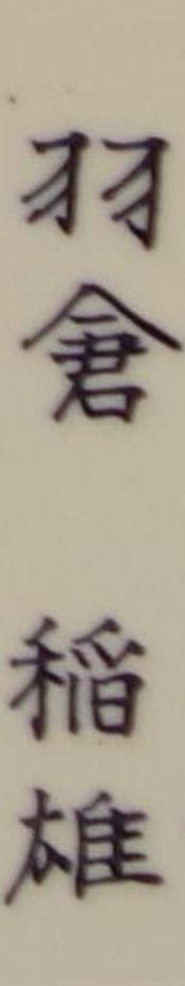羽倉稲雄
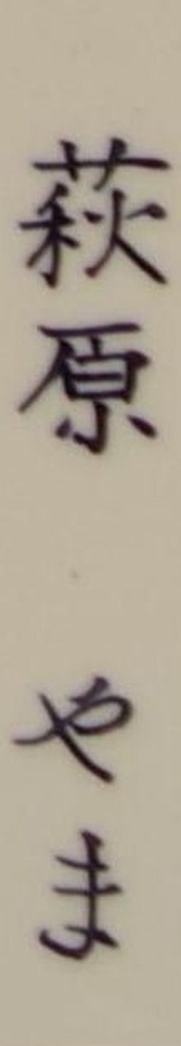萩原やま
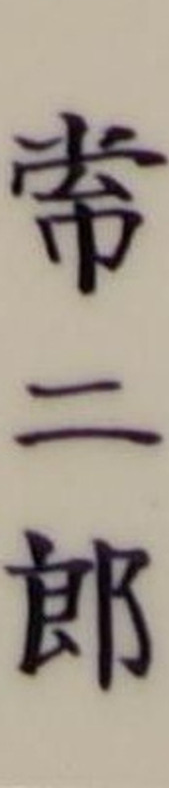常二郎
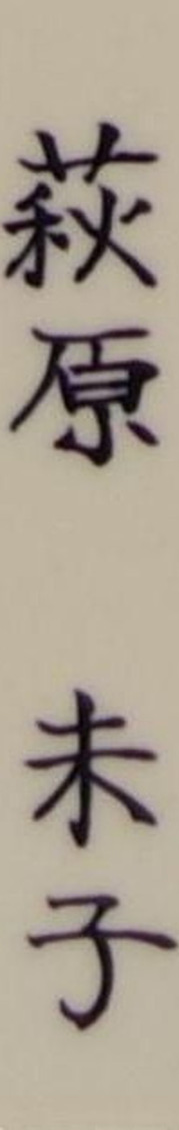萩原未子
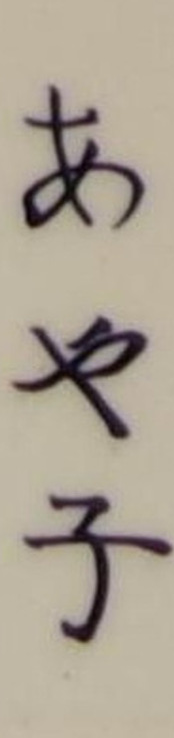あや子
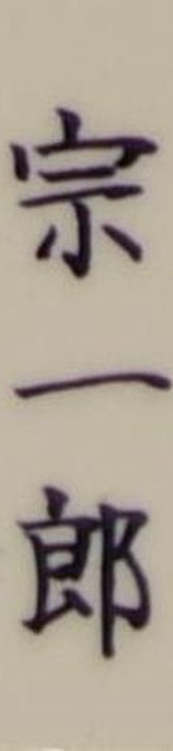宗一郎

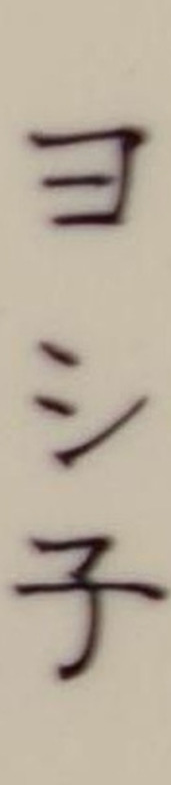ヨシ子
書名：M~S
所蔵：高野山金剛峯寺
